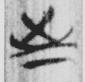至
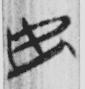𡚦（焉）
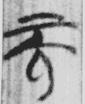而
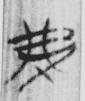弗
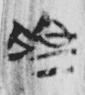爲
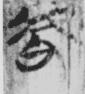○（乎）
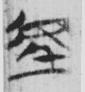○（吾）
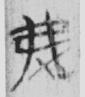弗
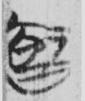智（知）
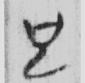也
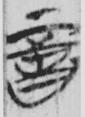意（抑）
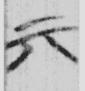亓
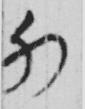力
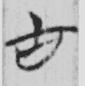古（固）
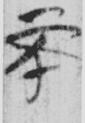不
